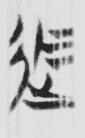{辶殳}
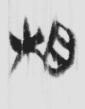相
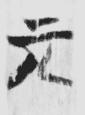亓
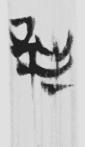邦
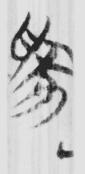{爪家}
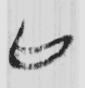㠯（以）
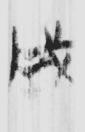成
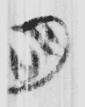名
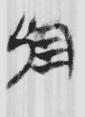於
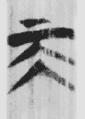天
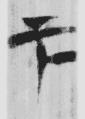下
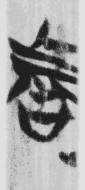者
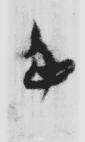身
